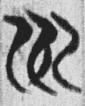州
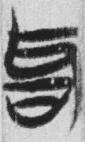○（始）
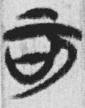可
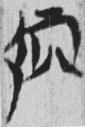凥（處）
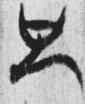也
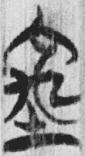○（禹）
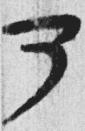乃
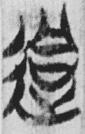迵（通）
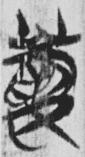蔞
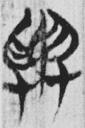與
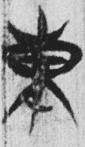東
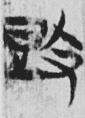○（注）
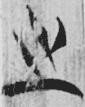之
